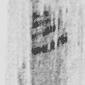回
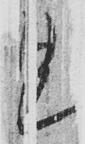也
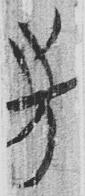先
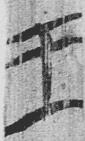王
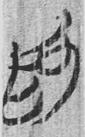爲
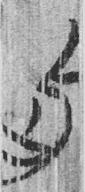此
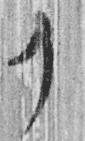人
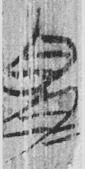{胃刀}（謂）
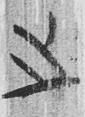之
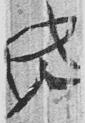𡚦
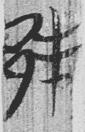邦
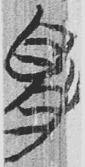{胃刀}（謂）
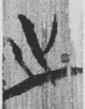之
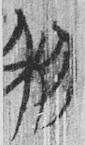利
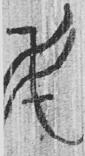民
